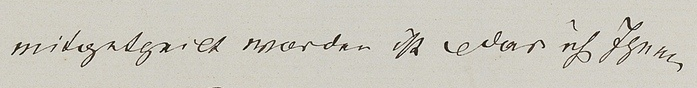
mitgetheilt worden ist & das ich Ihnen
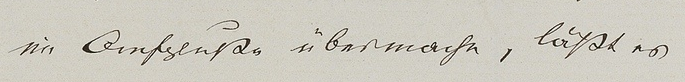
im Anschluße übermache, läßt es
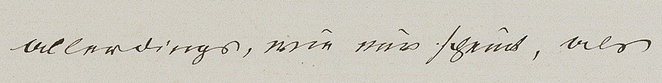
allerdings, wie mir scheint, als
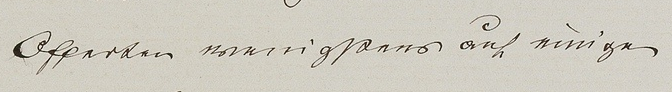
Offerten wenigstens auf einige
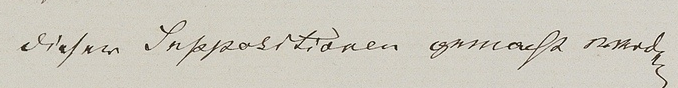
dieser Suppositionen gemacht werden.
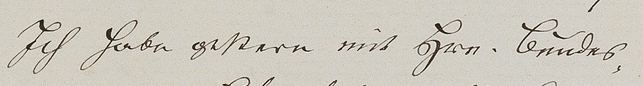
Ich habe gestern mit Hrn. Bundes-
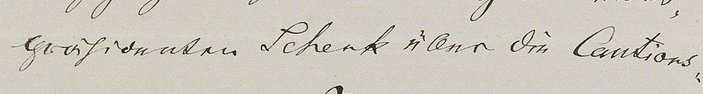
präsidenten Schenk über die Cautions -
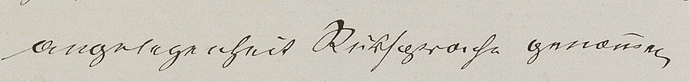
angelegenheit Rüksprache genommen
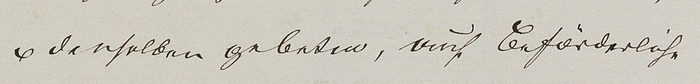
& denselben gebeten, auf beförderliche
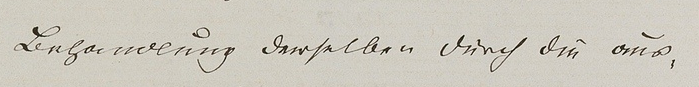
Behandlung derselben durch die aus-
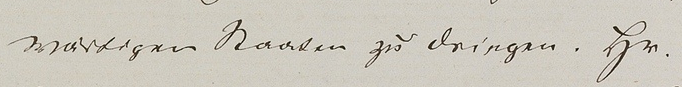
wärtigen Staaten zu dringen. Hr.
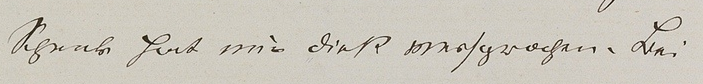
Schenk hat mir dieß versprochen. Bei
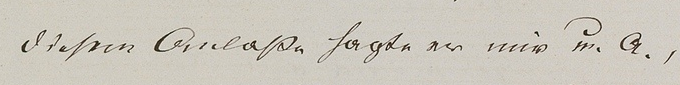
diesem Anlaße sagte er mir u. A.,
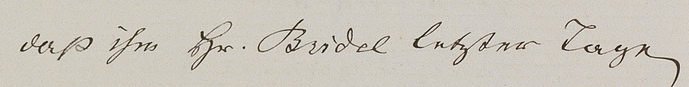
daß ihm Hr. Bridel letzter Tage
